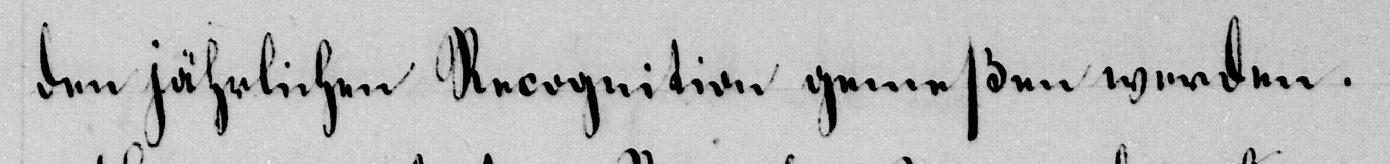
den jährlichen Recognition gemeßen werden.
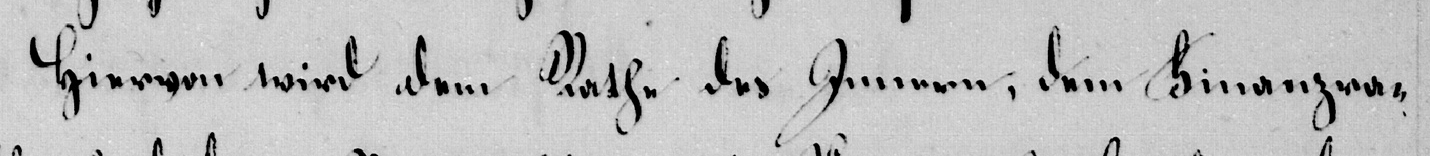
Hiervon wird dem Rathe des Innern, dem Finanzra¬
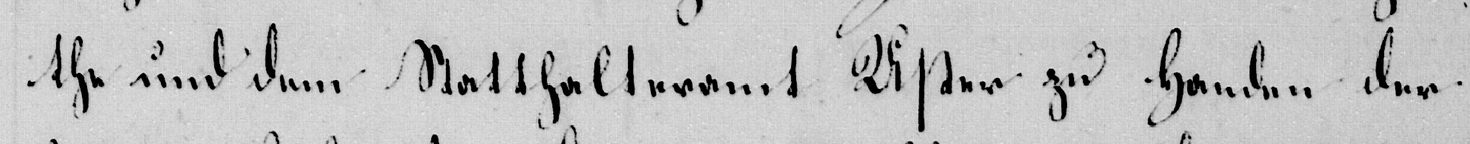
the und dem Statthalteramt Uster zu Handen der
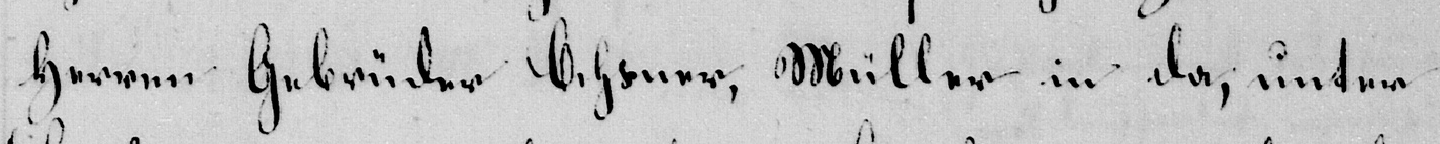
Herren Gebrüder Ochsner, Müller in da, unter
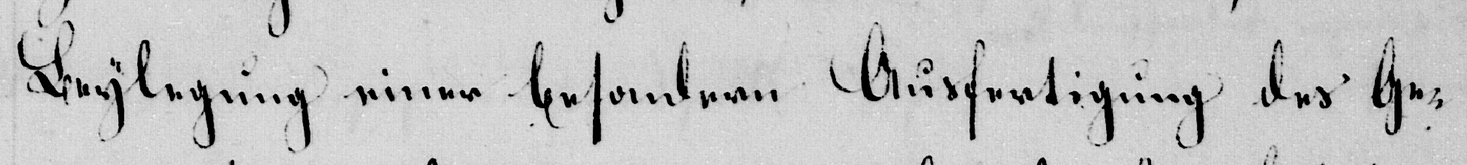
Beylegung einer besondern Ausfertigung des Ge¬
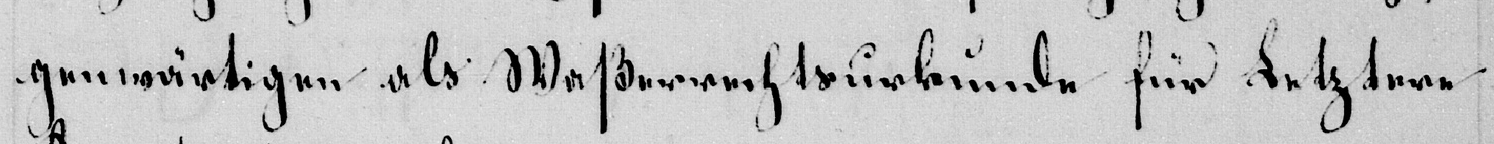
genwärtigen als Waßerrechtsurkunde für Letztere
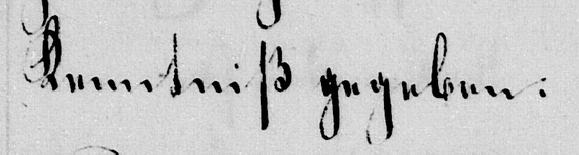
Kenntniß gegeben.
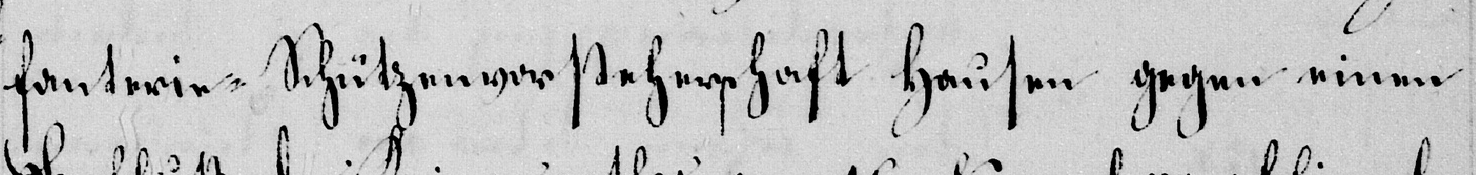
fanterie-Schützenvorsteherschaft Hausen gegen einen
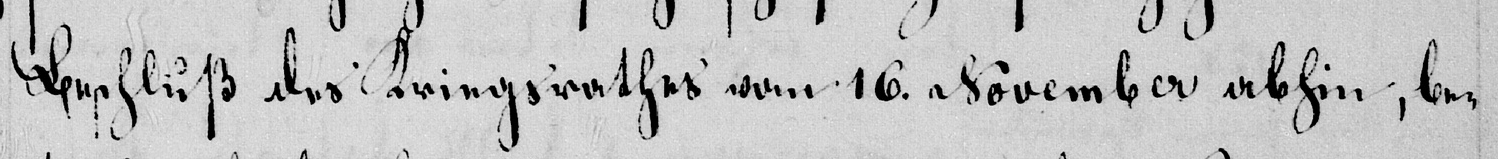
Beschluß des Kriegsrathes vom 16. September abhin, be¬
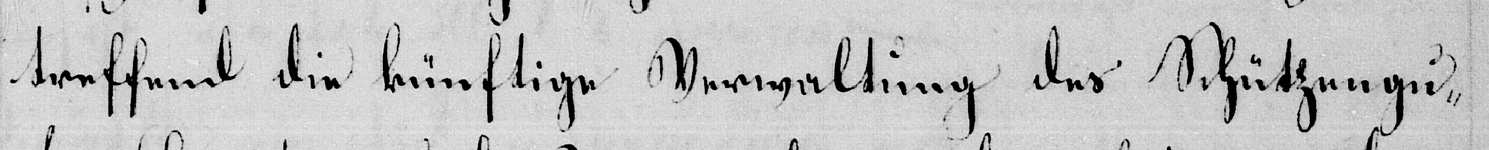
treffend die künftige Verwaltung des Schützengu¬
